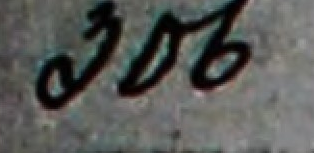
306
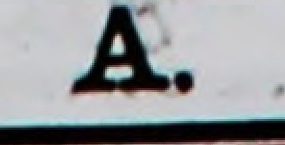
A.
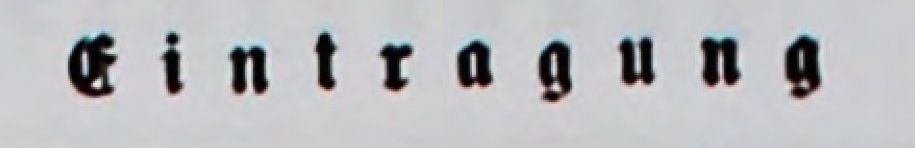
Eintragung
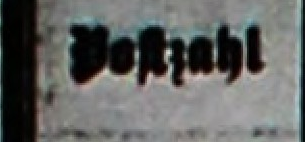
Postzahl
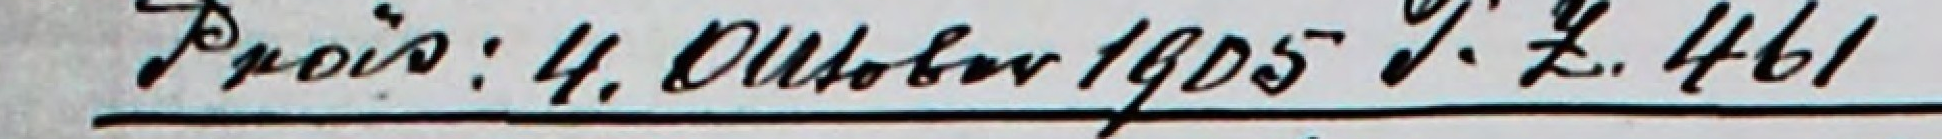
Präs: 4. Oktober 1905 T.Z. 461
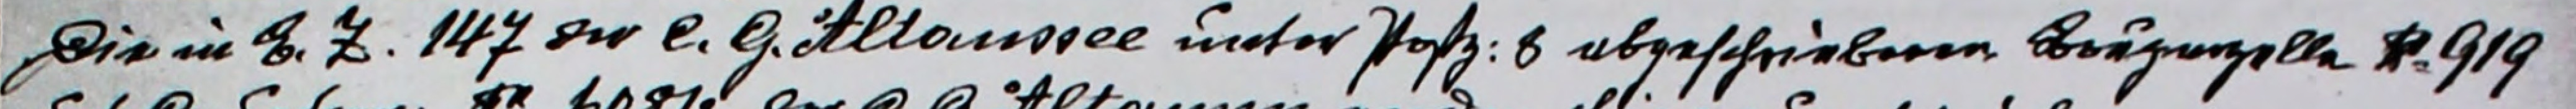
Die in E.Z. 147 der C.G. Altaussee unter Postz: 8 abgeschriebenen Bauparzelle No 919
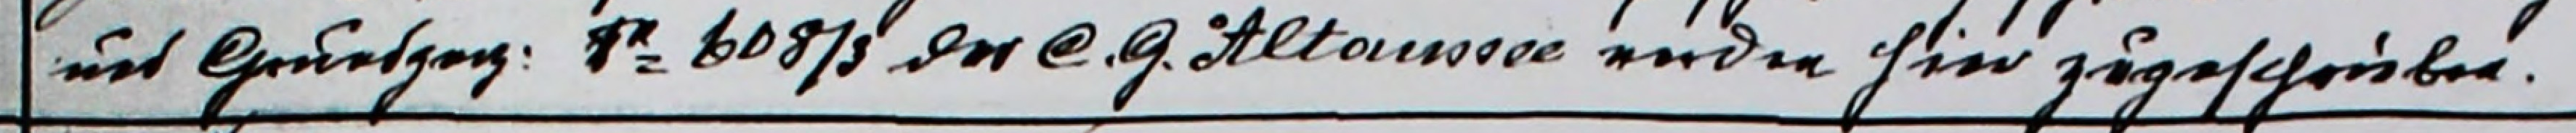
imd Grundparz: Nr 608/3 der C.G. Altaussee werden hier zugeschrieben.
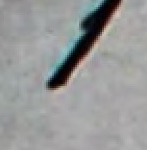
1
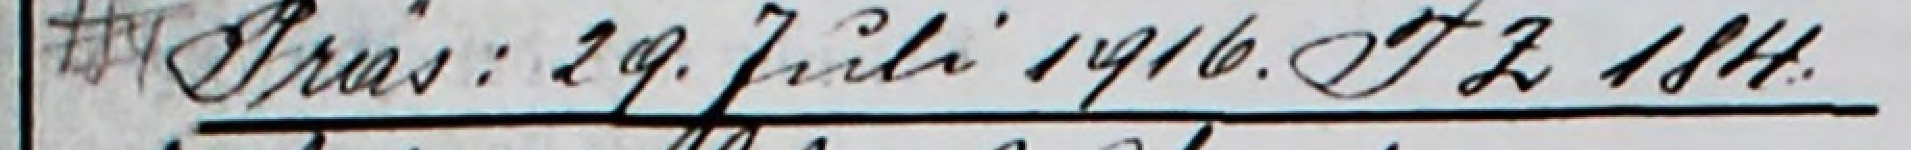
184 Präs: 29. Juli 1916. T Z 184.
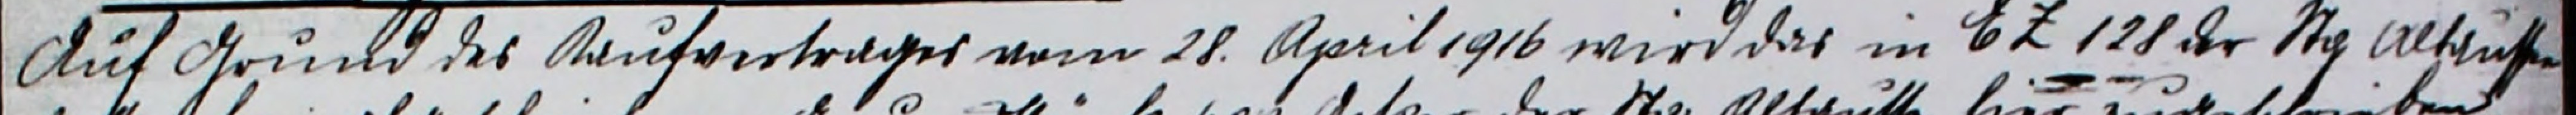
Auf Grund des Kaufvertrages vom 28. April 1916 wird das in E Z 128 der Stg Altaussee
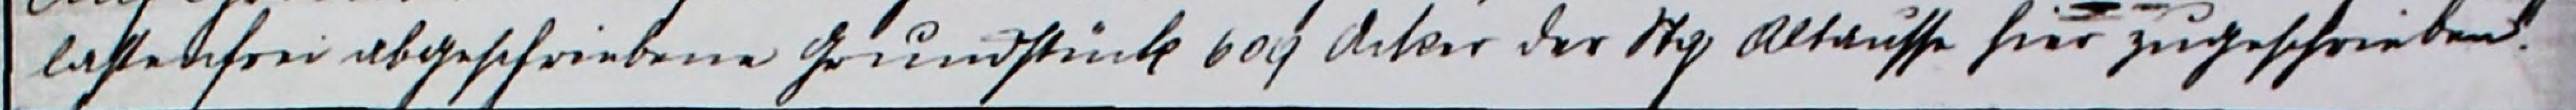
lastenfrei abgeschriebene Grundstück 609 Acker der Stg Altaussee hier zugeschrieben.
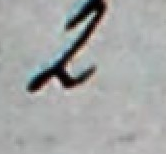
2
